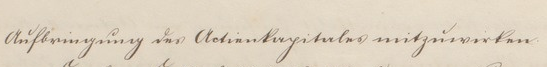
Aufbringung des Actienkapitales mitzuwirken.
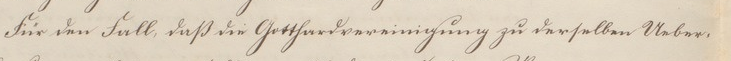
Für den Fall, daß die Gotthardvereinigung zu derselben Ueber-
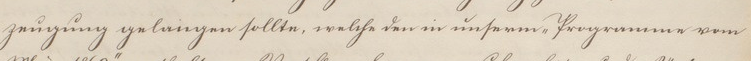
zeugung gelangen sollte, welche den in unserm «Programme vom
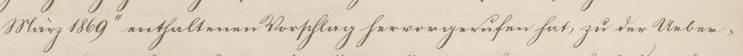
März 1869» enthaltenen Vorschlag hervorgerufen hat, zu der Ueber-
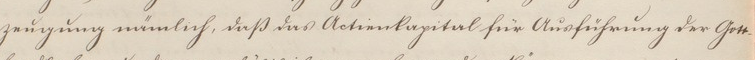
zeugung nämlich, daß das Actienkapital für Ausführung der Gott-
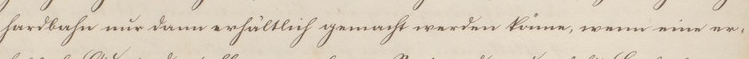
hardbahn nur dann erhältlich gemacht werden könne, wenn eine er-
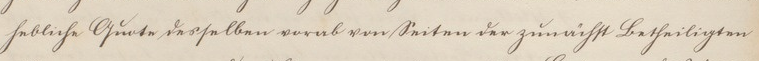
hebliche Quote desselben vorab von Seiten der zunächst Betheiligten
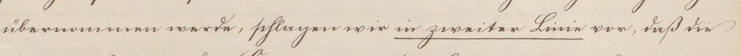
übernommen werde, schlagen wir in zweiter Linie vor, daß die
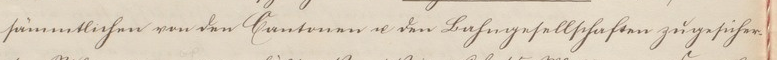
sämmtlichen von den Cantonen & den Bahngesellschaften zugesicher-
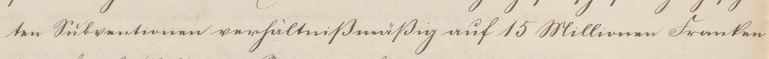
ten Subventionen verhältnißmäßig auf 15 Millionen Franken
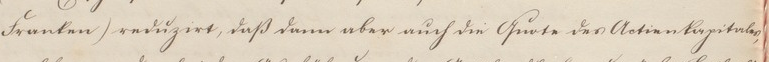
Franken) reduzirt, daß dann aber auch die Quote des Actienkapitales,
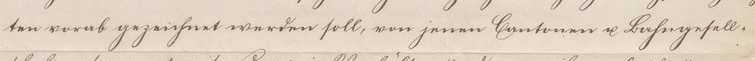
ten vorab gezeichnet werden soll, von jenen Cantonen & Bahngesell-
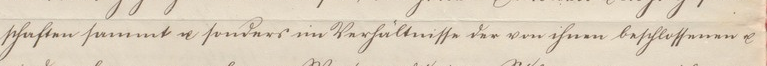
schaften sammt & sonders im Verhältnisse der von ihnen beschlossenen &
